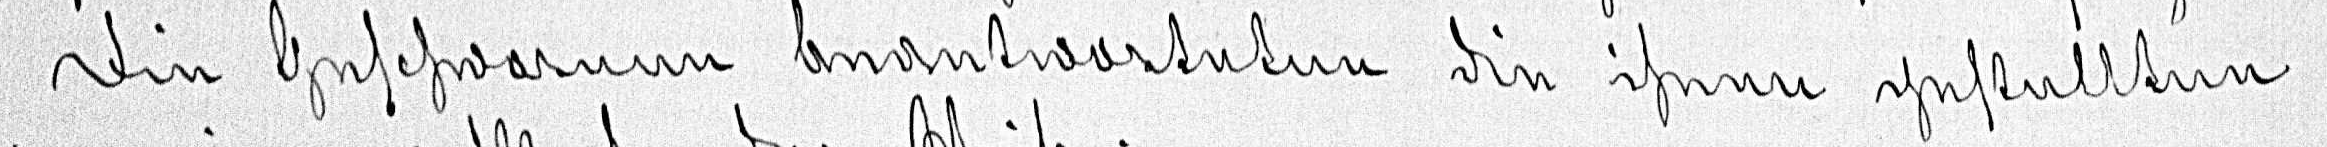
Die Geschworene beantworteten die ihnen gestellten
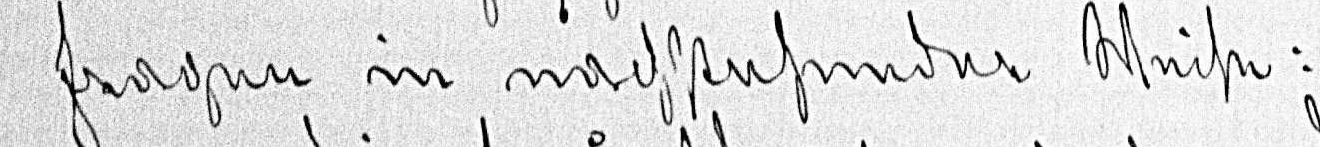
Fragen in nachstehender Weise:
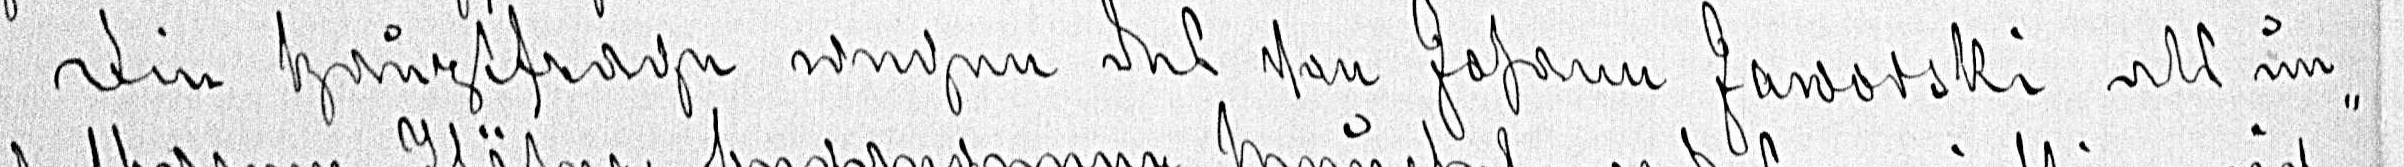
Die Hauptfrage wegen des von Johann Jaworski als un¬
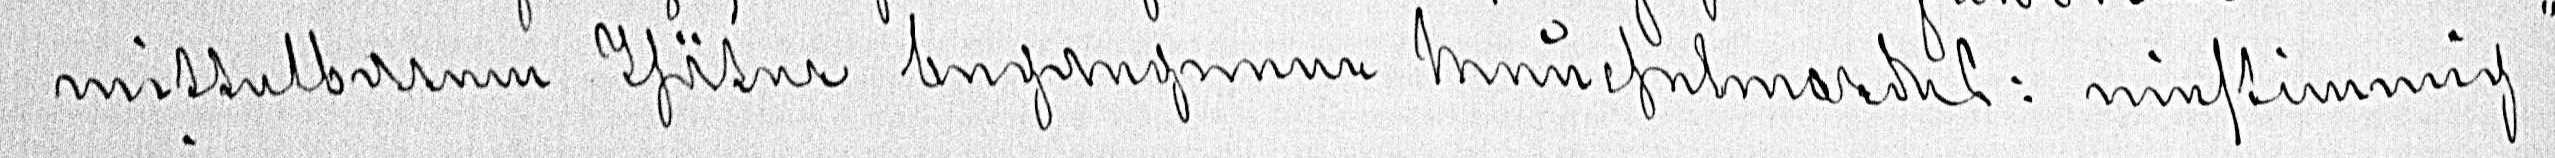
mittelbarem Thäter begangener Meuchelmordes: einstimmig
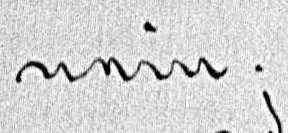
nein.
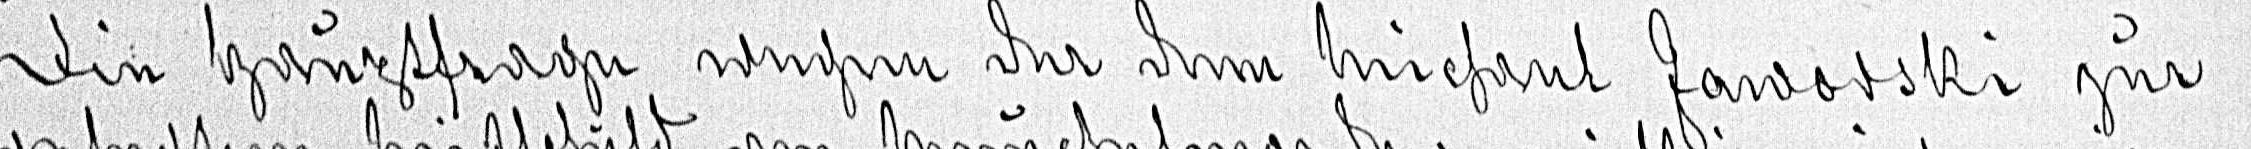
Die Hauptfrage wegen der dem Michael Jaworski zur
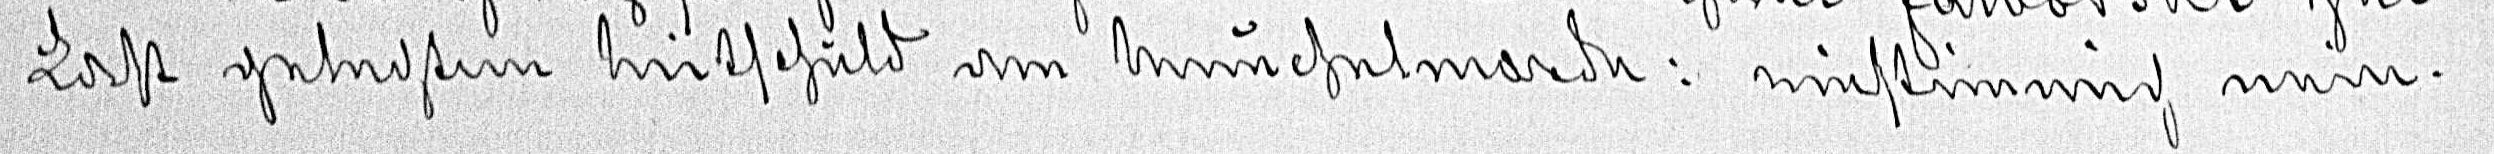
Last gelegten Mitschuld am Meuchelmorde: einstimmig nein.
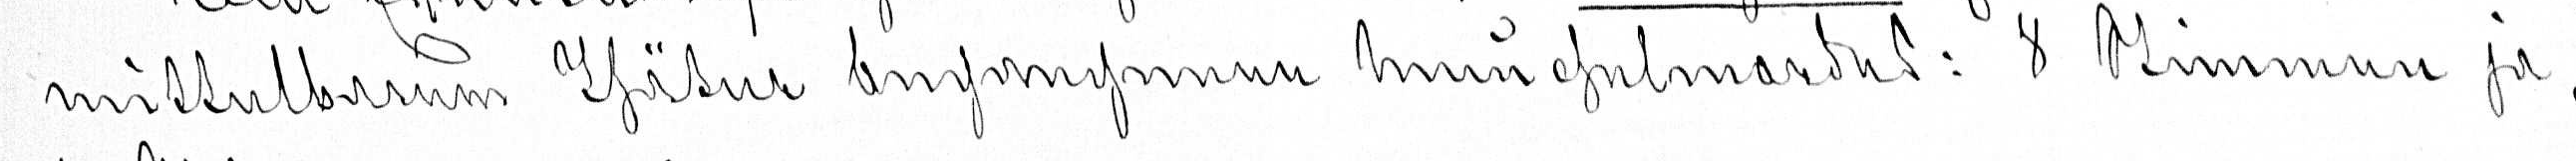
mittelbarer Thäter begangenen Meuchelmordes: 8 Stimmen ja,
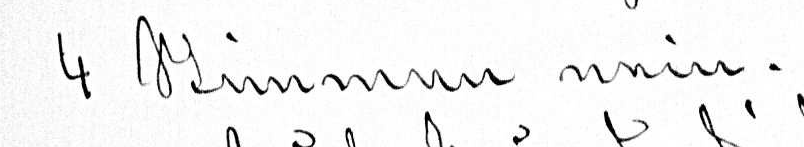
4 Stimmen nein.
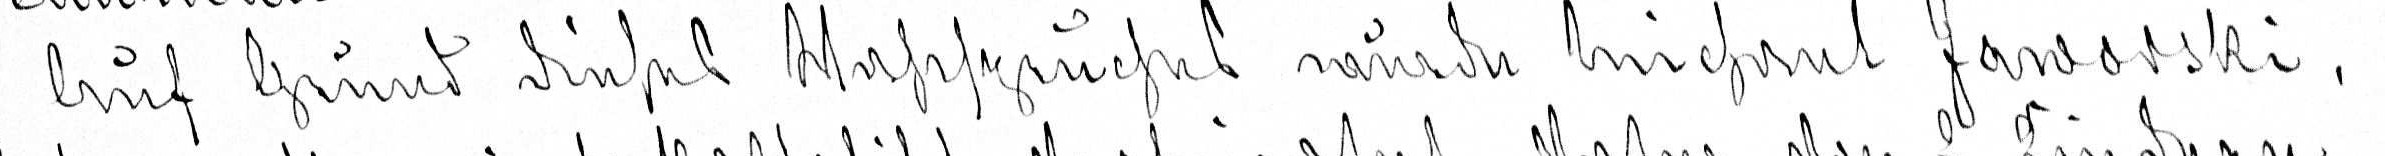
Auf Grund dieses Wahrspruches wurde Michael Jaworski,
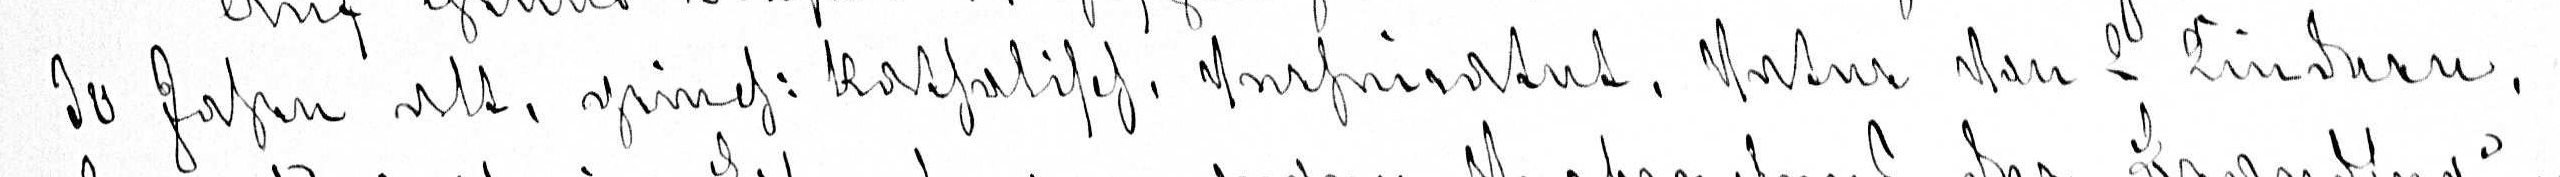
30 Jahre alt, griech-katholisch, verheiratet, Vater vom 2 Kindern,
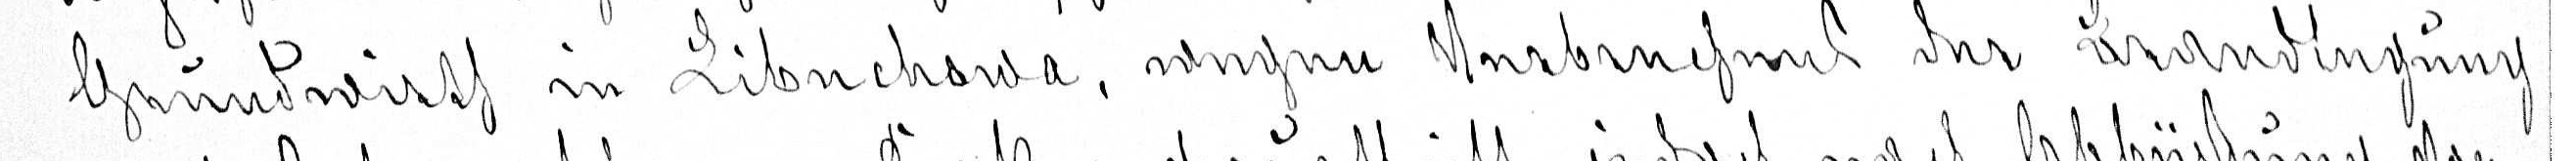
Grundwirth in Libuchowa, wegen Verbrechens der Brandlegung
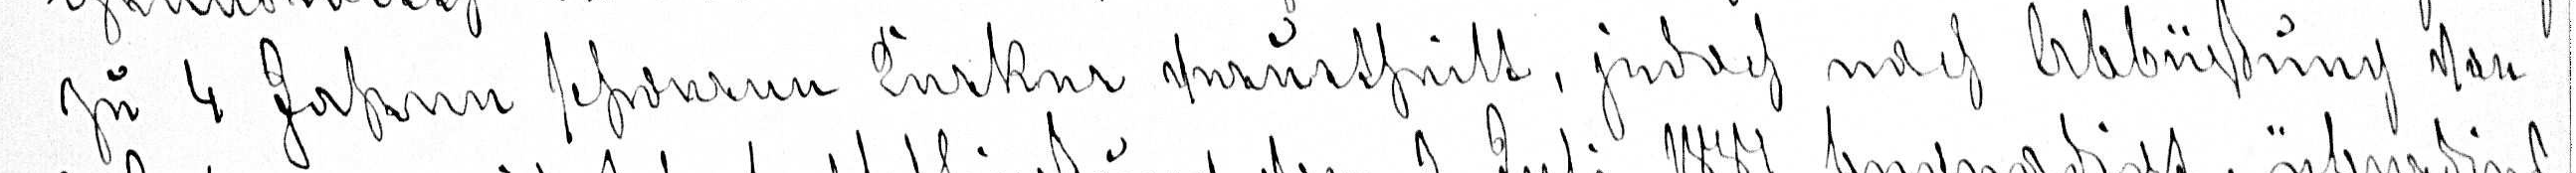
zu 4 Jarhen schweren Kerker verurtheilt, jedoch nach Abbüßung von
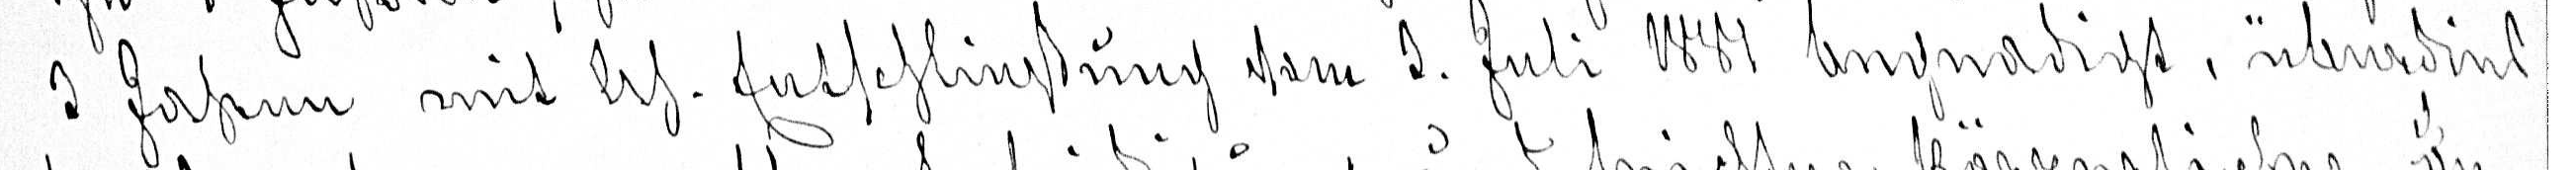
3 Jahren mit Ah. Entschließung vom 3. Juli 1884 begnadigt, überdies
